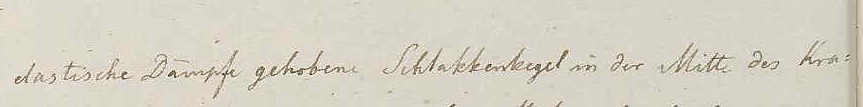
elastische Dämpfe gehobene Schlakkenkegel in der Mitte des Kra-
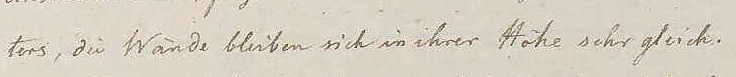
ters, die Wände bleiben sich in ihrer Höhe sehr gleich.
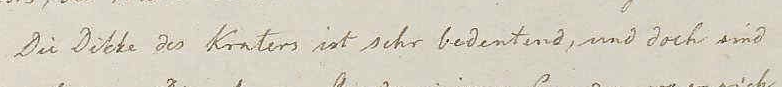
Die Dikke des Kraters ist sehr bedeutend, und doch sind
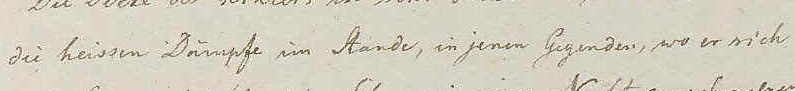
die heissen Dämpfe im Stande, in jenen Gegenden, wo er sich
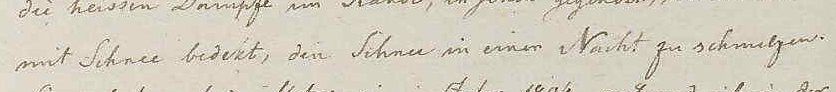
mit Schnee bedekt, den Schnee in einer Nacht zu schmelzen.
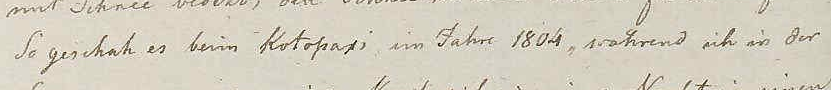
So geschah es beim Kotopaxi, im Jahre 1804, während ich in der
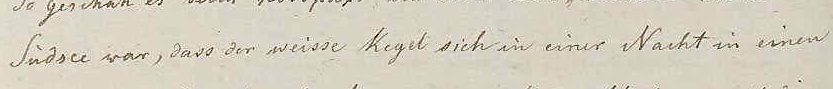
Südsee war, dass der weisse Kegel sich in einer Nacht in einen
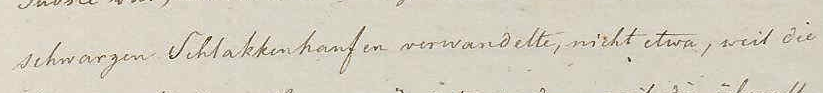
schwarzen Schlakkenhaufen verwandelte, nicht etwa, weil die
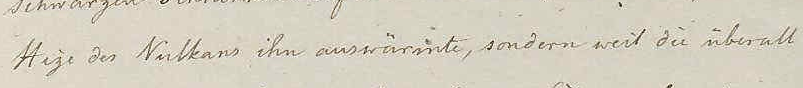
Hize des Vulkans ihn auswärmte, sondern weil die überall
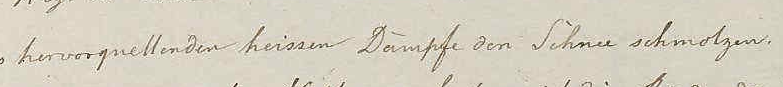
hervorquellenden heissen Dämpfe den Schnee schmolzen.
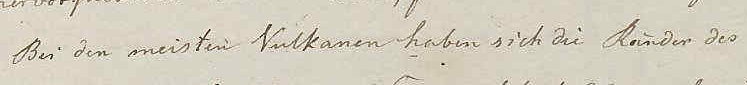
Bei den meisten Vulkanen haben sich die Ränder des
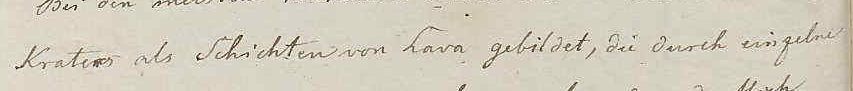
Kraters als Schichten von Lava gebildet, die durch einzelne
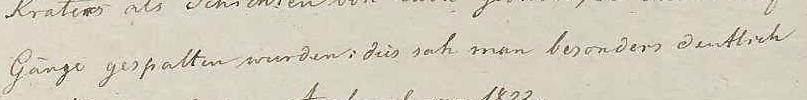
Gänge gespalten wurden: dies sah man besonders deutlich
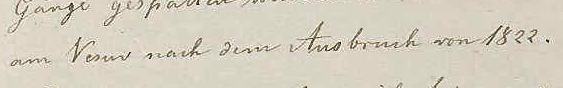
am Vesuv nach dem Ausbruch von 1822.
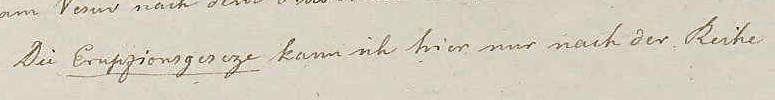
Die Erupzionsgeseze kann ich hier nur nach der Reihe
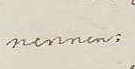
nennen:
